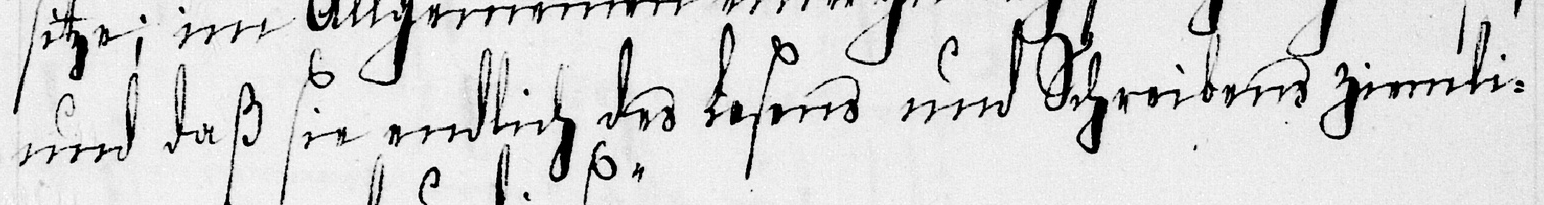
und daß sie endlich des Lesens und Schreibens ziemli¬
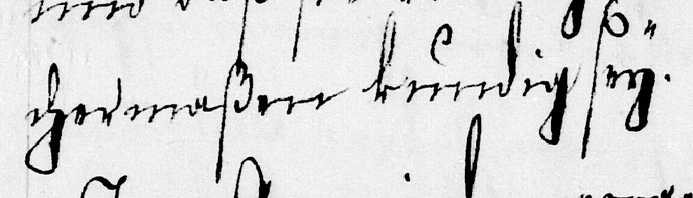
chermaßen kundig sey.
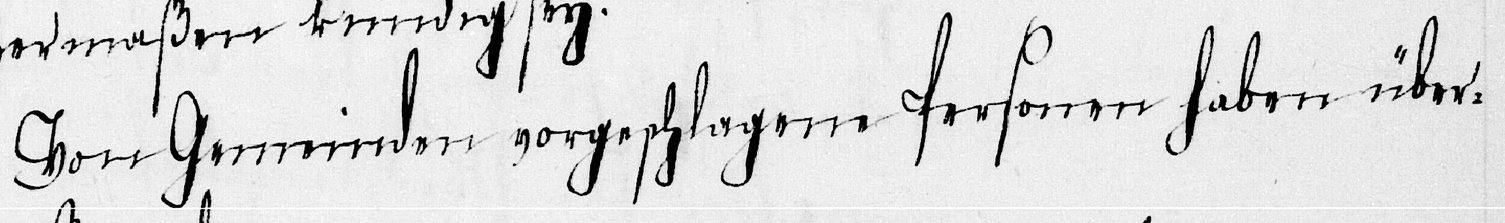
Von Gemeinden vorgeschlagene Personen haben über¬
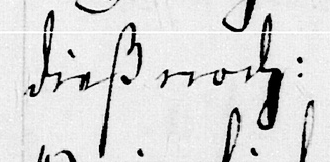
dieß noch:
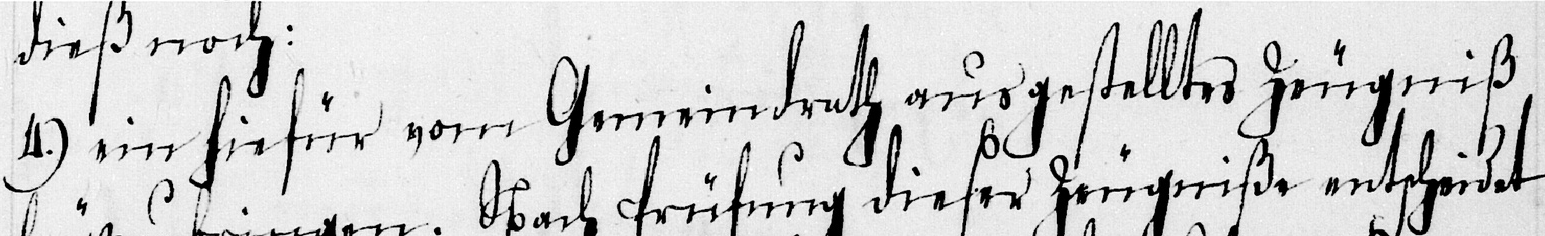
4.) ein hiefür vom Gemeindrath ausgestelltes Zeugniß
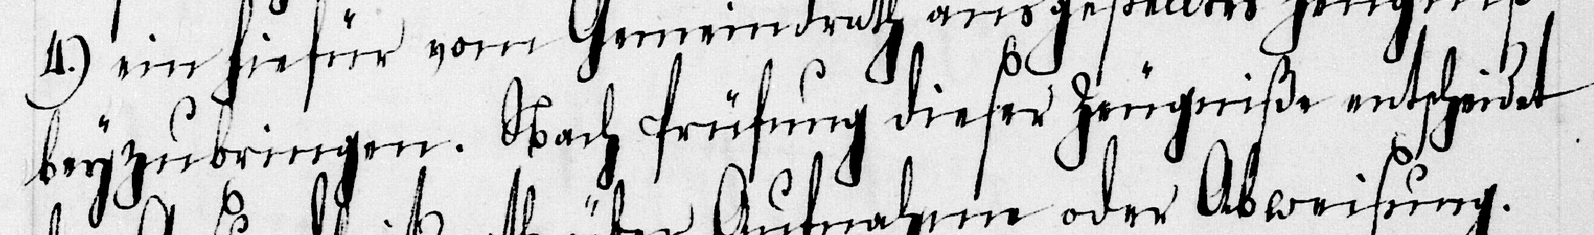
beyzubringen. Nach Prüfung dieser Zeugniße entscheidet
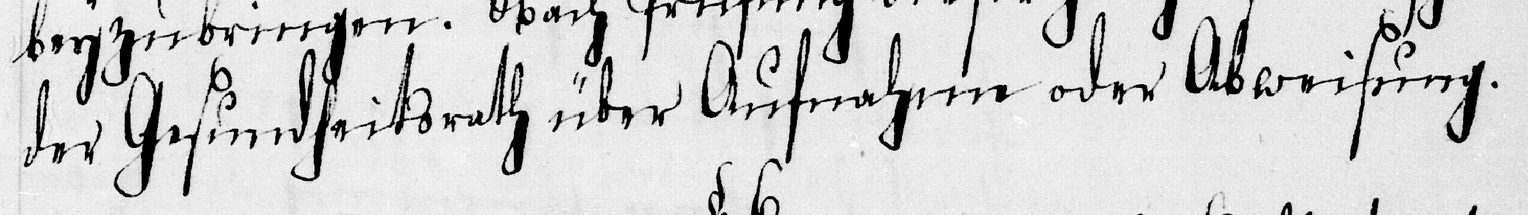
der Gesundheitsrath über Aufnahme oder Abweisung.
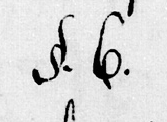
§. 6.
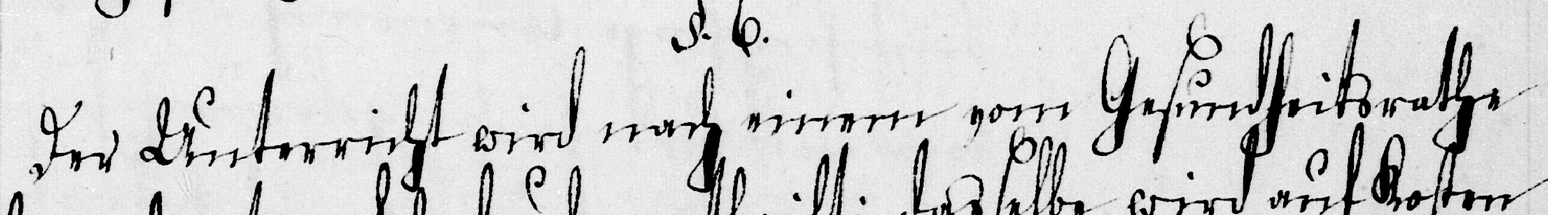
Der Unterricht wird nach einem vom Gesundheitsrathe
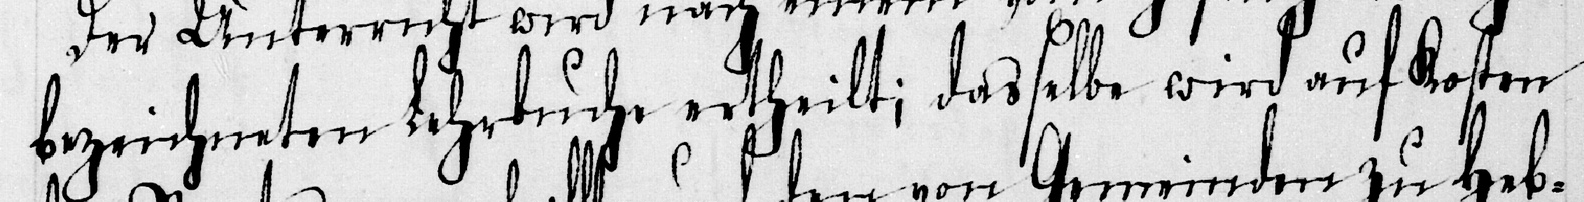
bezeichneten Lehrbuche ertheilt; dasselbe wird auf Kosten
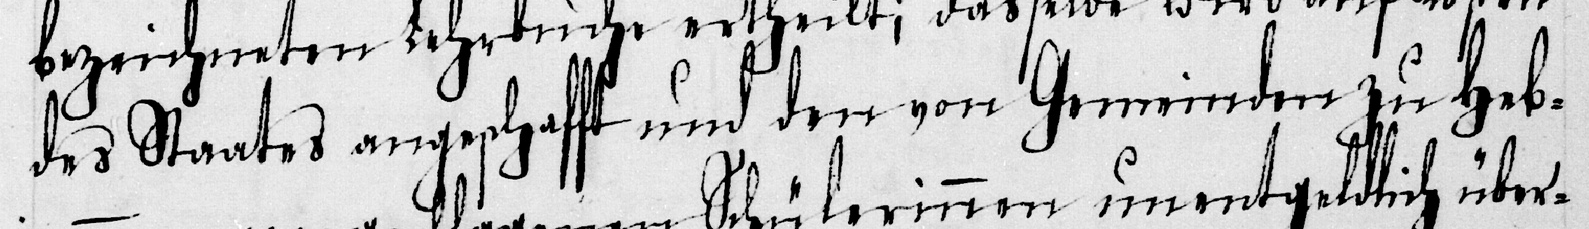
des Staates angeschafft und den von Gemeinden zu Heb¬
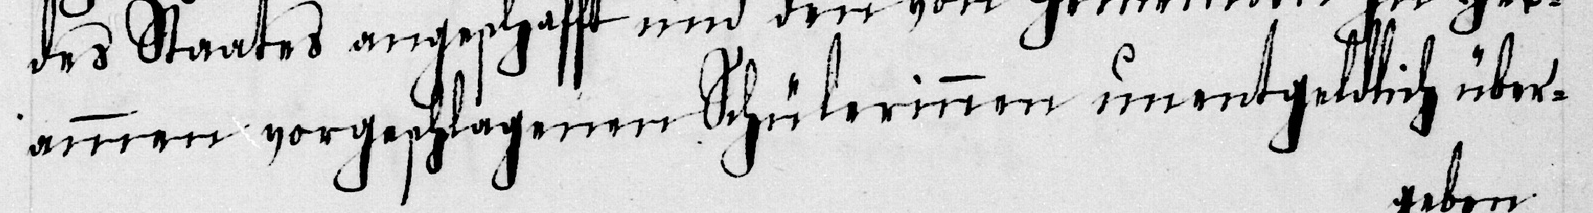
ammen vorgeschlagenen Schülerinnen unentgeldlich über-
